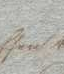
kann.
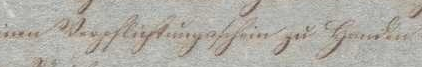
einen Verpflichtungsschein zu Handen
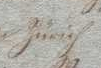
Schweiz.
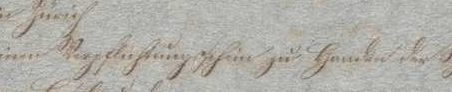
einen Verpflichtungsschein zu Handen der
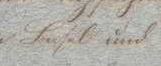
in Basel und
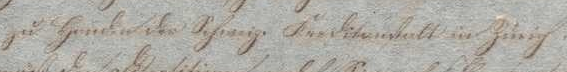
zu Handen der Schweiz. Kreditanstalt in Zürich.
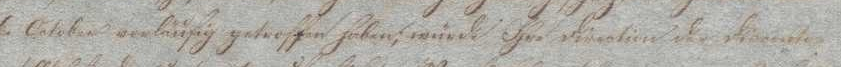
26. October vorläufig getroffen haben, würde Ihre Direction der Disconto-
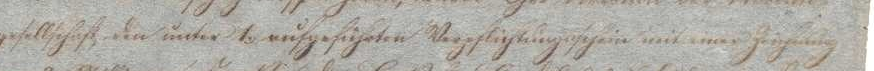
gesellschaft, den unter 1, aufgeführten Verpflichtungsschein mit einer Zeichnung
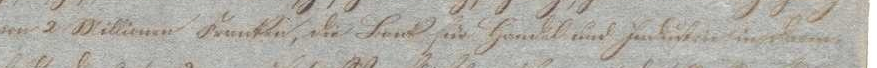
von 2 Millionen Franken, die Bank für Handel und Industrie in Darm-
